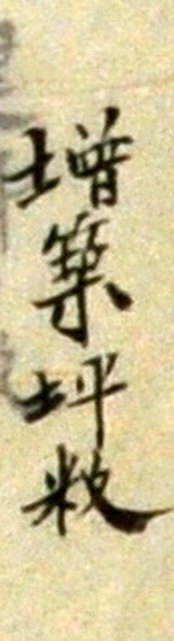増築坪数
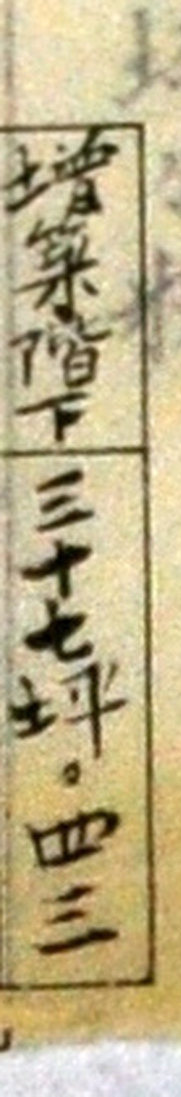増築階下三十七坪/四三
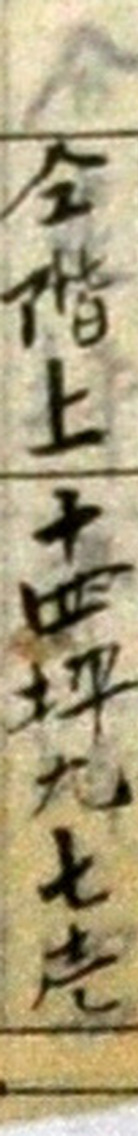仝階上十四坪九七壱
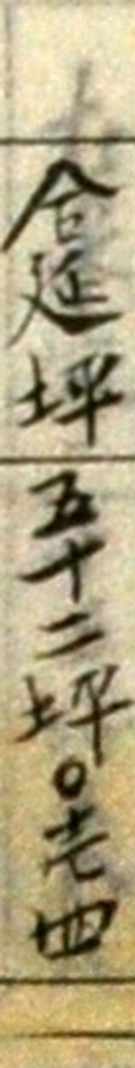合延坪五十二坪○壱四
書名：鎌倉御別邸改築平面図（案）
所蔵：伊那市立高遠町図書館・合同会社AMANE
